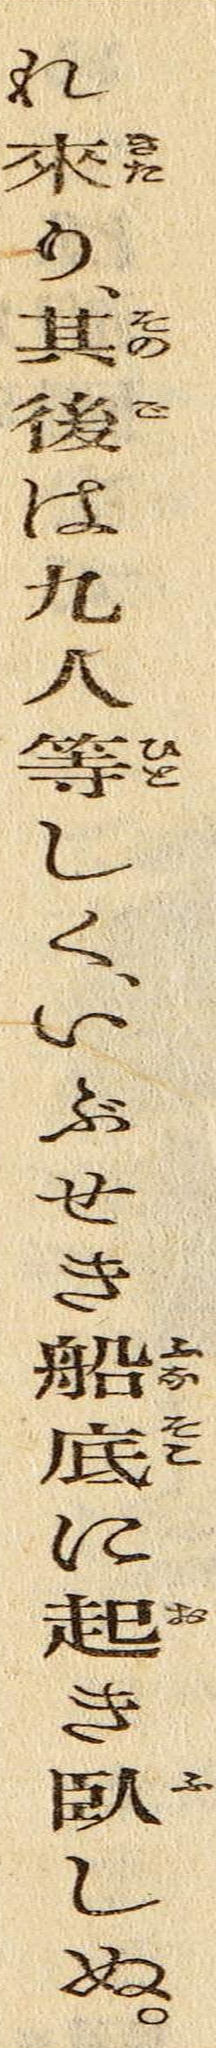れ来り、其後は九人等しく、いぶせき船底に起き臥しぬ。
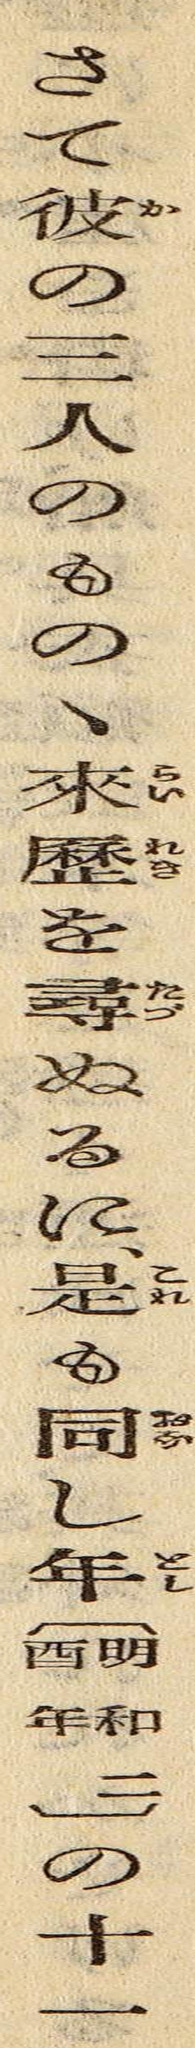さて彼の三人のものヽ来歴を尋ぬるに、是も同し年[明和二酉年]の十一
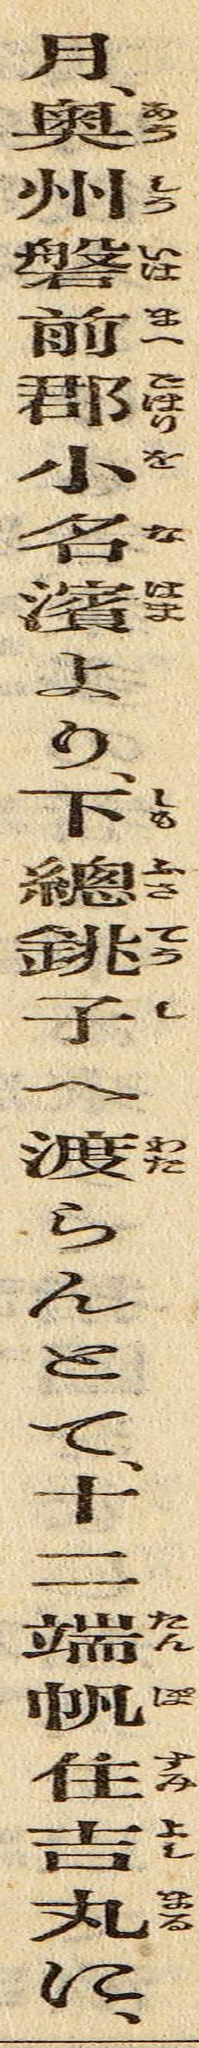月、奥州磐前郡小名浜より、下総銚子へ渡らんとて、十二端帆住吉丸に、
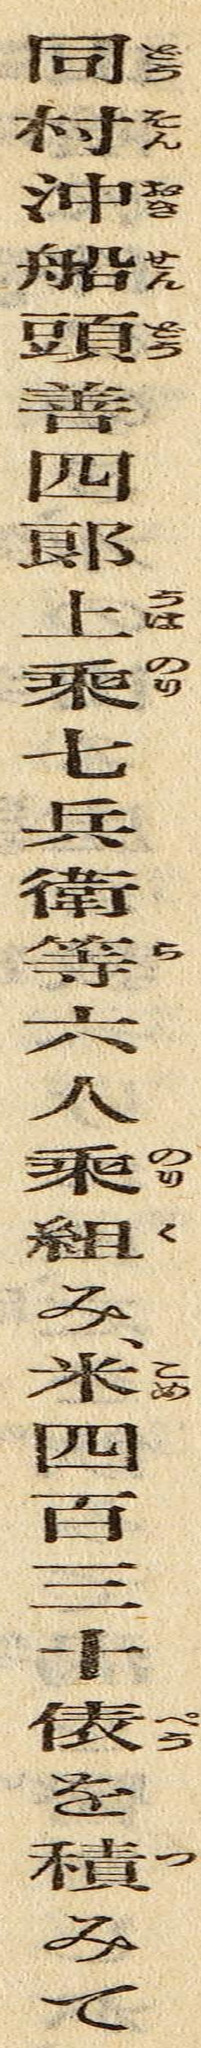同村沖船頭善四郎上乗七兵衛等六人乗組み、米四百三十俵を積みて
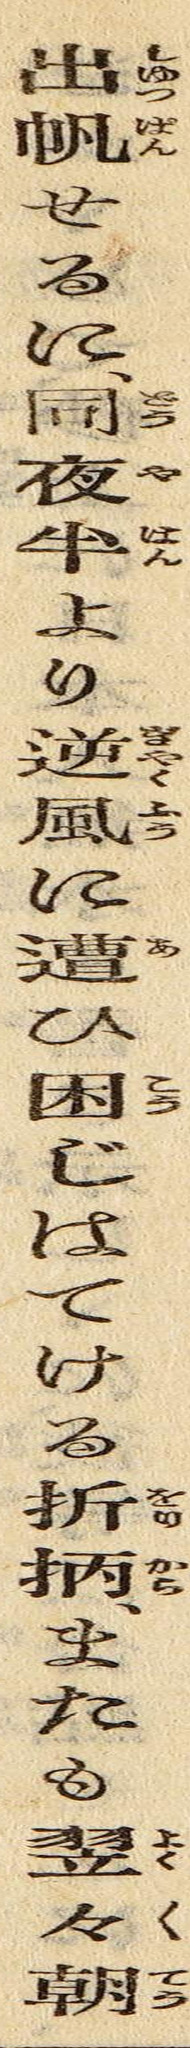出帆せるに、同夜半より逆風に遭ひ困じはてける折柄、またも翌々朝
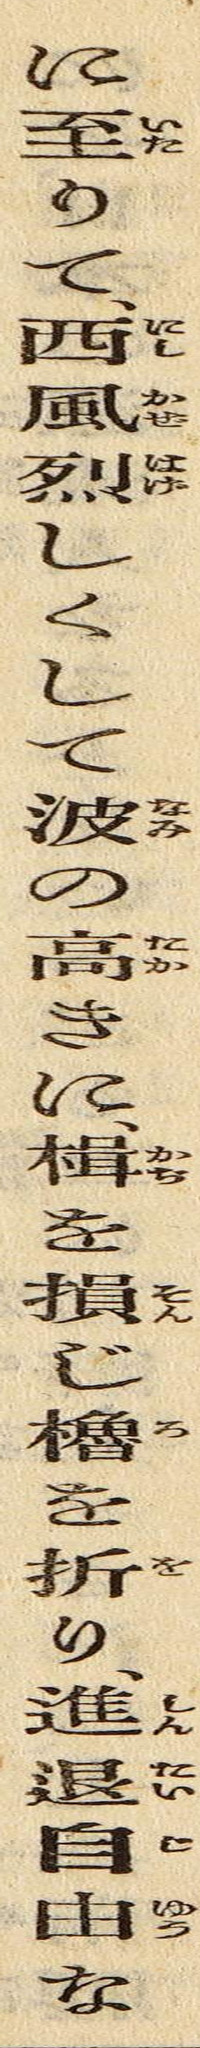に至りて、西風烈しくして波の高きに、楫を損じ櫓を折り、進退自由な
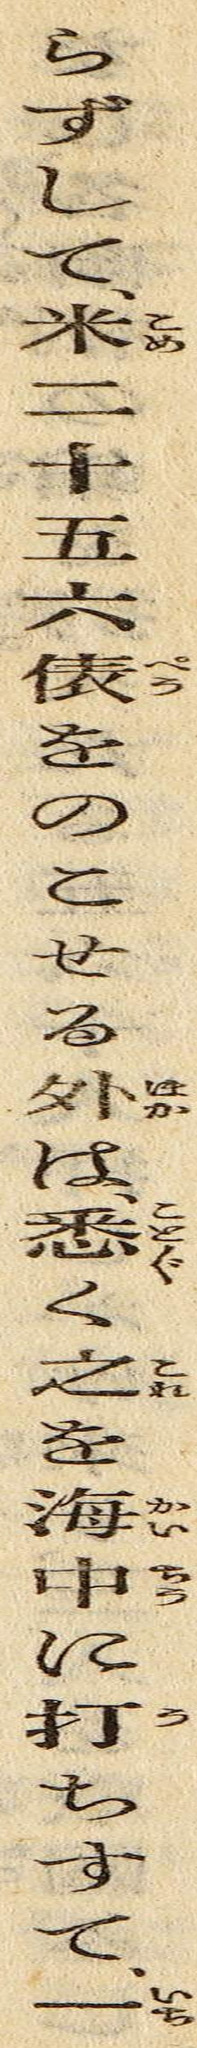らずして、米二十五六俵をのこせる外は、悉く之を海中に打ちすて、一
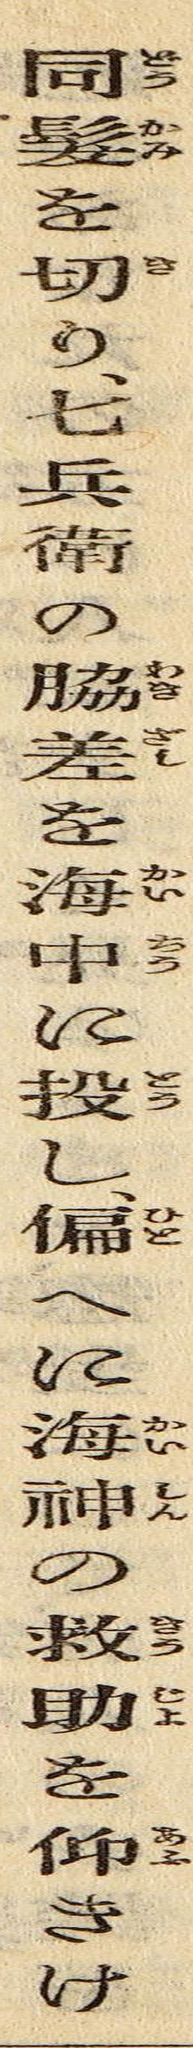同髪を切り、七兵衛の脇差を海中に投し、偏へに海神の救助を仰きけ
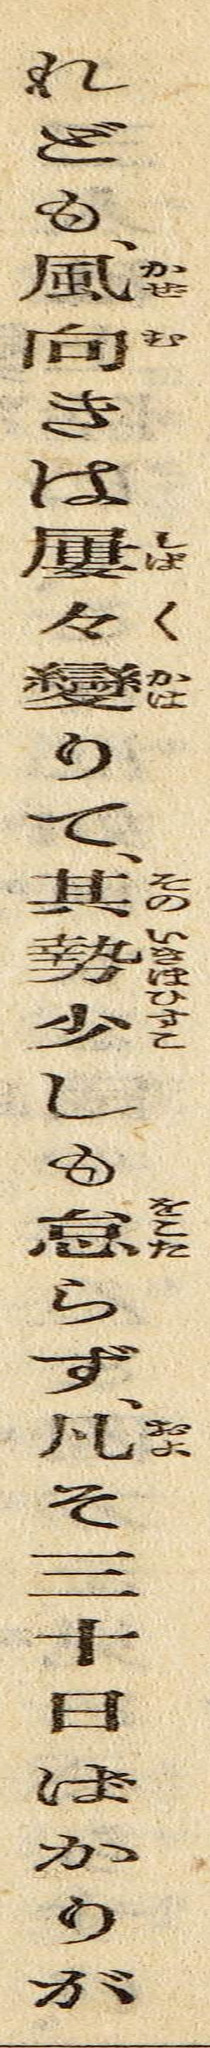れども、風向きは屢々変りて、其勢少しも怠らず、凡そ三十日ばかりが
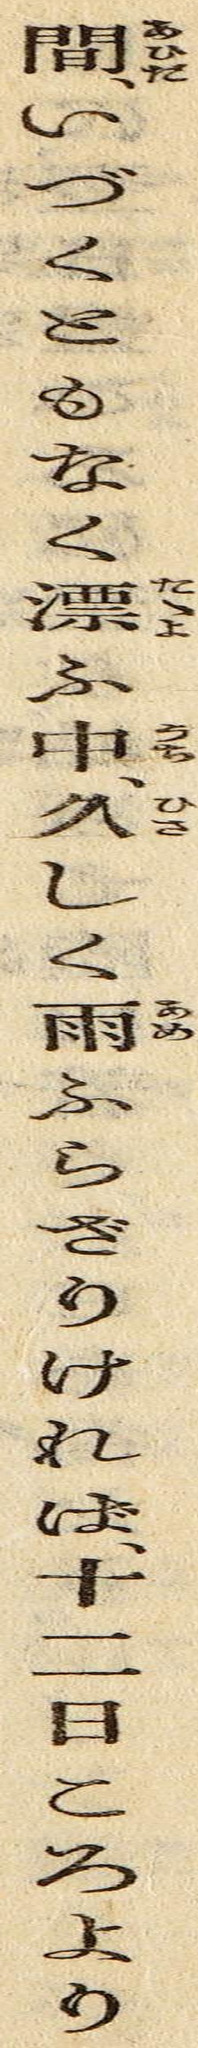間、いづくともなく漂ふ中、久しく雨ふらざりければ、十二日ころより
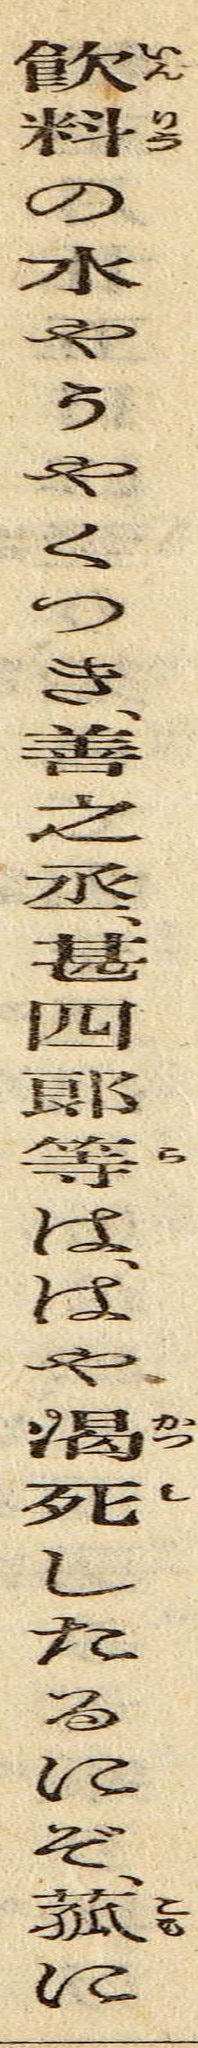飲料の水やうやくつき、善之丞、甚四郎等は、はや渇死したるにぞ、菰に
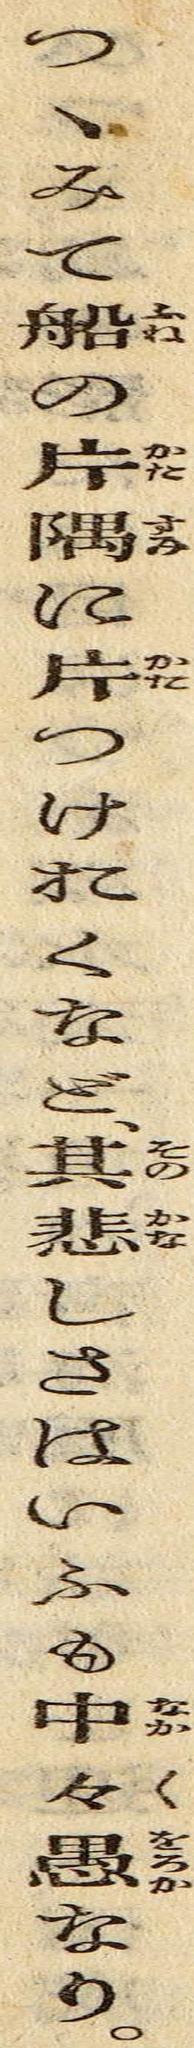つヽみて船の片隅に片つけおくなど、其悲しさはいふも中々愚なり。
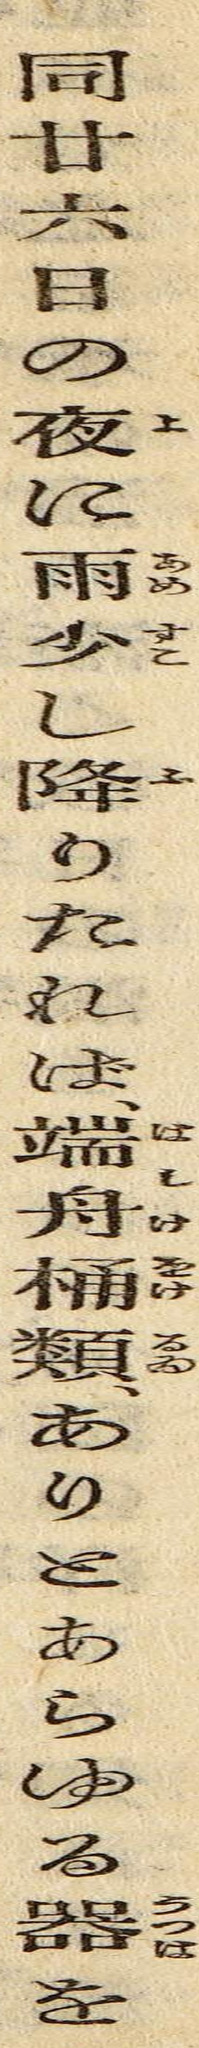同廿六日の夜に雨少し降りたれば、端舟桶類、ありとあらゆる器を

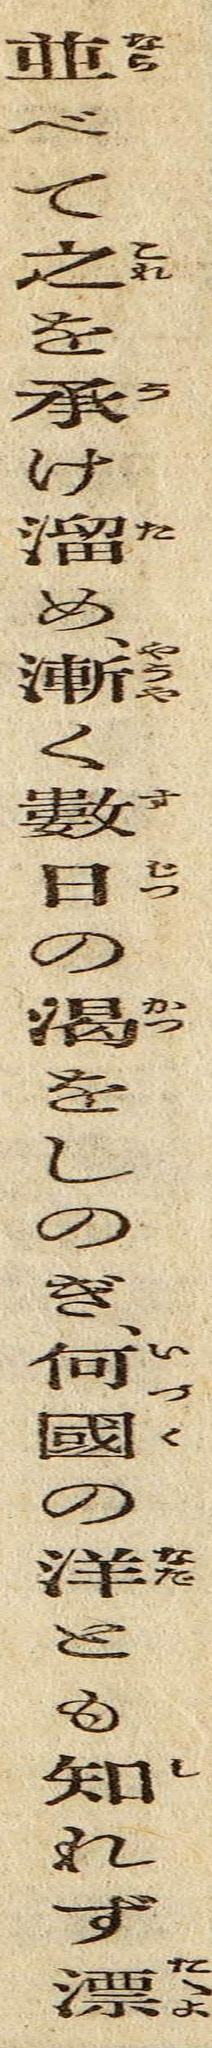並べて之を承け溜め、漸く数日の渇をしのぎ、何国の洋とも知れず漂
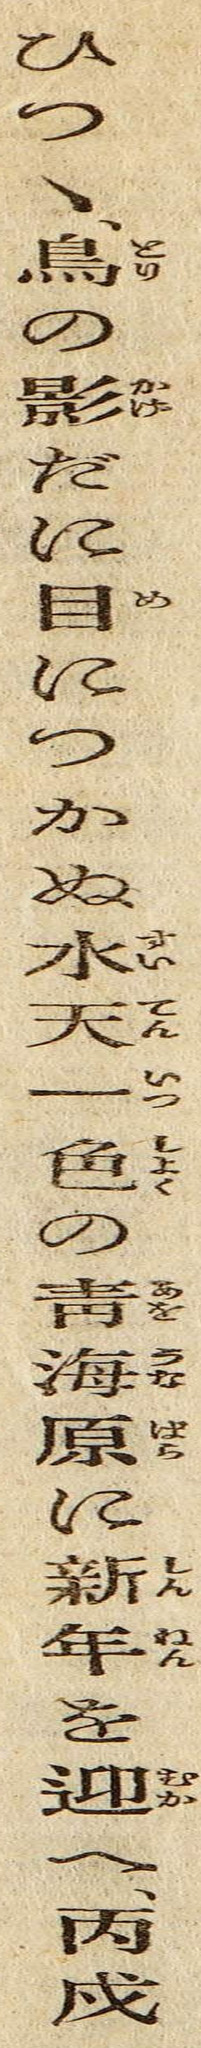ひつヽ、鳥の影だに目につかぬ水天一色の青海原に新年を迎へ、丙戌
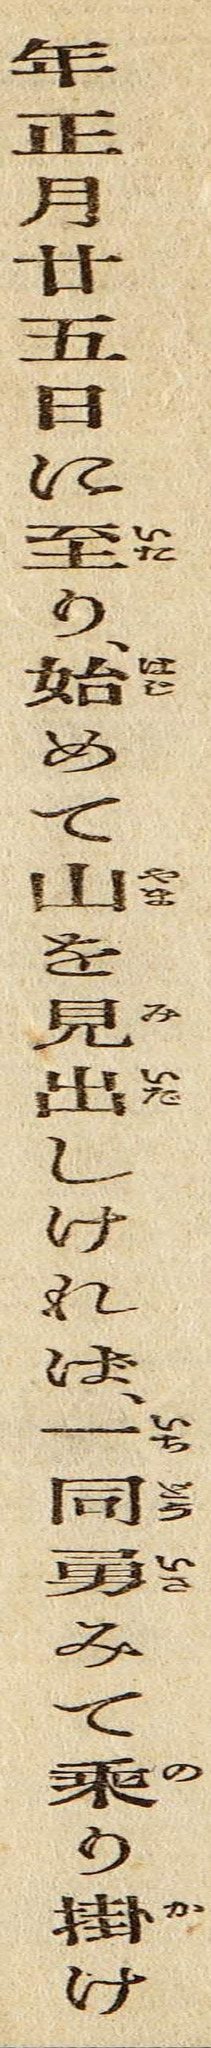年正月廿五日に至り、始めて山を見出しければ、一同勇みて乗り掛け
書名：日本漂流譚
